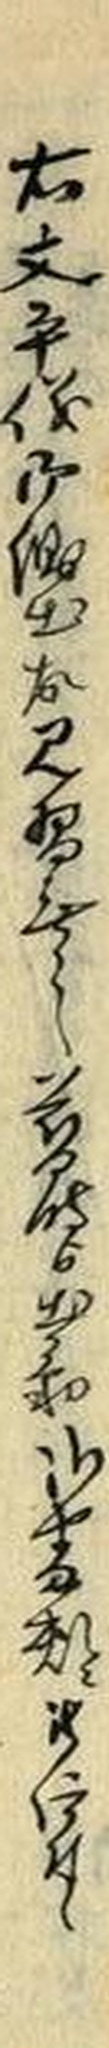右文平儀御側出故見習無之暮時ゟ出勤弐番頬ニ被仰付候
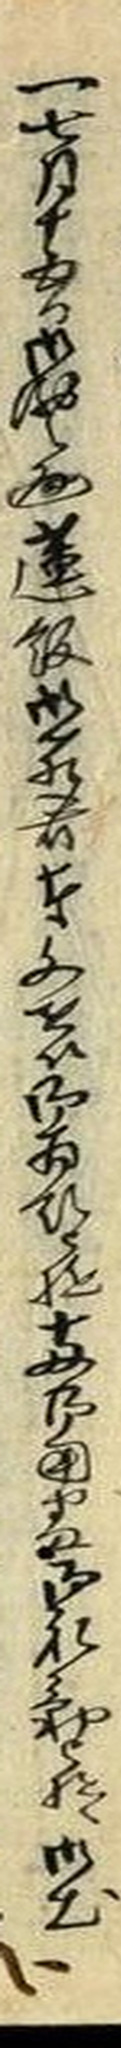一七月十五日御例之通蓮飯御箱肴奉文を以御拝領被遊両御用番御礼勤被遊候御出
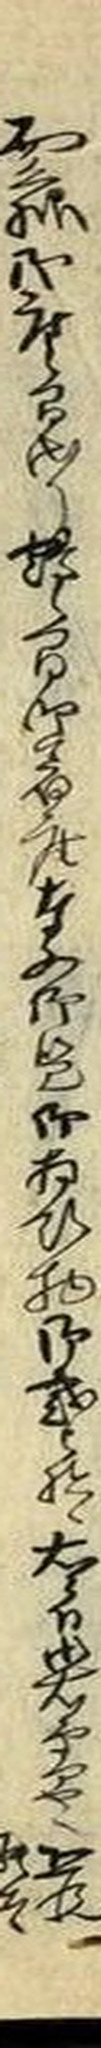殿掛御座之間代り鶴之間御着座奉文御覧御拝領物御戴被遊候右ニ付御右筆部やへ恐悦罷出候
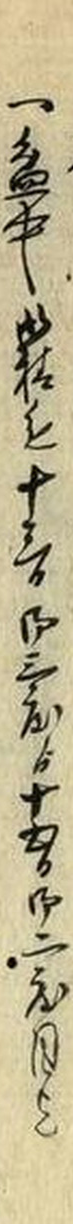一盆中御精進十三日御三度ゟ十五日御二度目迄
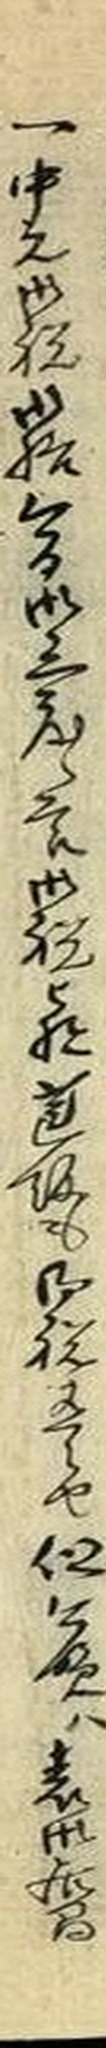一中元御祝御膳今日御三度之節御祝被遊蓮飯も御祝有之候由但今晩ハ表御居間
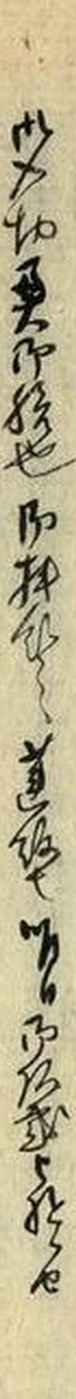御〆切奥御膳也御拝領之蓮飯は昨日御頂戴被遊候由
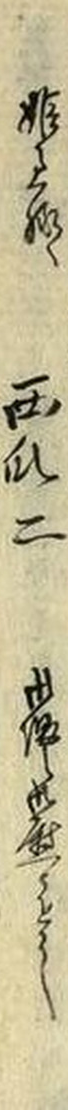姫君様へ西瓜二御側之御慰ニ被進之
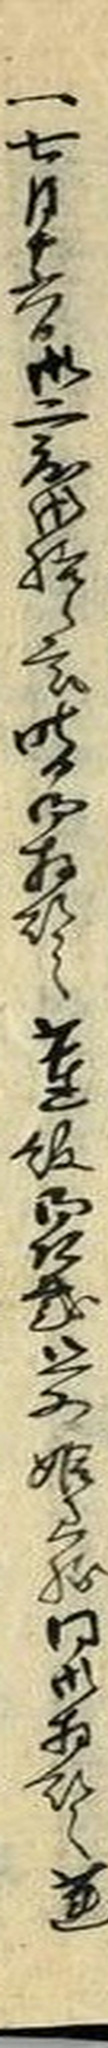一七月十六日御二度御膳之節昨日御拝領之蓮飯御頂戴且又姫君様同御拝領之蓮
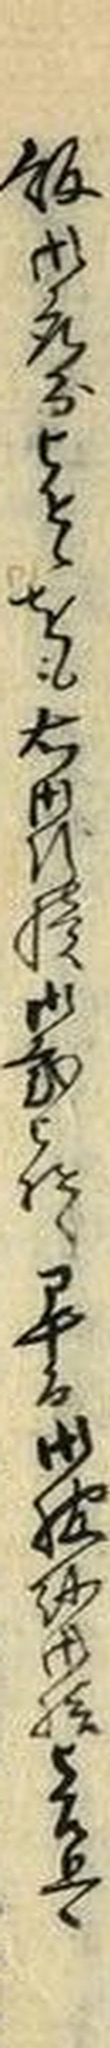飯御取分被進候をも右御引続御戴被遊候畢而御服紗御膳被召上候
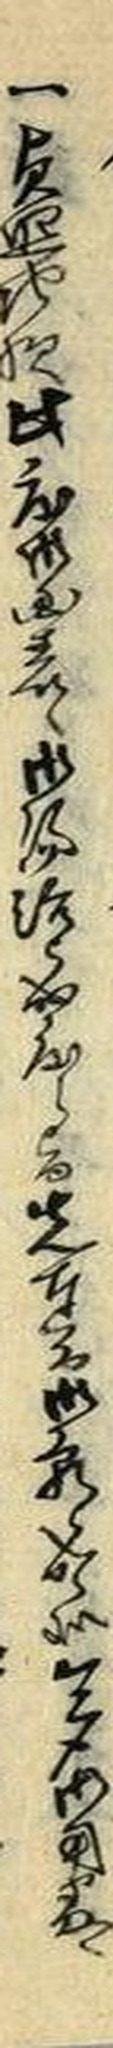一貞照院様此度御国表へ御湯治被成度之旨先達而御願被成候処今夕御用番へ
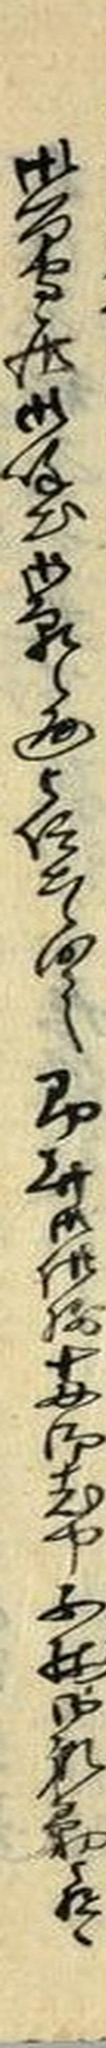御留守居御呼出御願之通被仰出候仍之即刻御供揃両御老中不残御礼勤被遊候
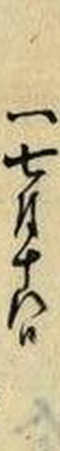一七月十八日
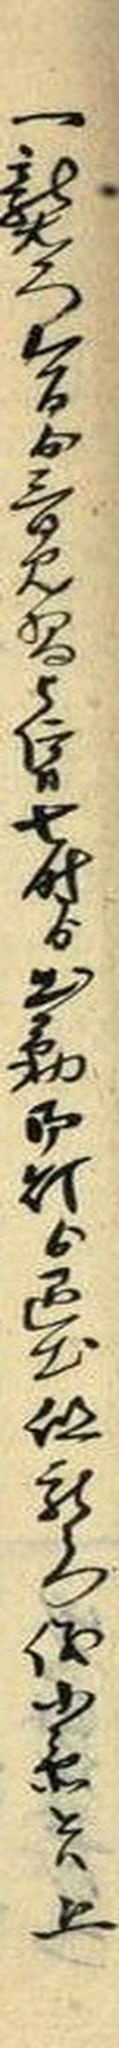一新右衛門今日ゟ三日見習被仰付候七時ゟ出勤御灯ゟ退出但新右衛門儀小兵衛とハ上
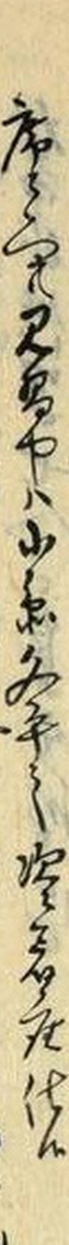席ニ候へ共見習中ハ小兵衛文平之次ニ着座仕候
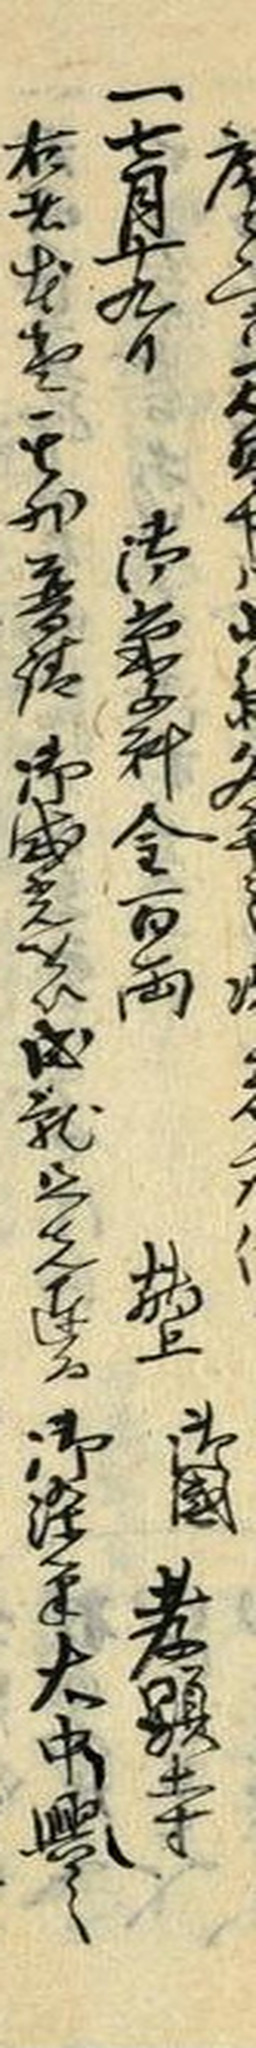右は本堂其外普請御威光を以成就且先達而御染筆右中興之
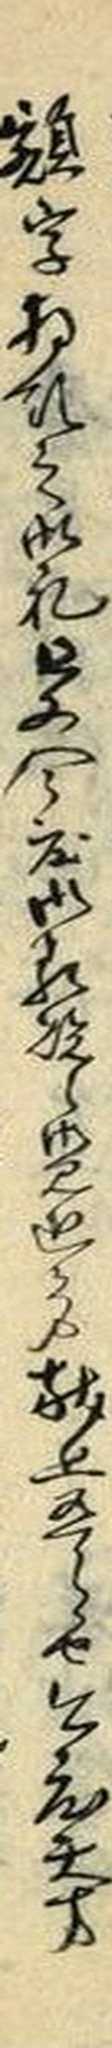額字拝領之御礼且又今度御類焼之御見廻方献上有之候由今度天方
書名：少傅日録抄（斉承付側向頭取日記、在府）
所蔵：福井県文書館 Fukui Prefectural Archives
